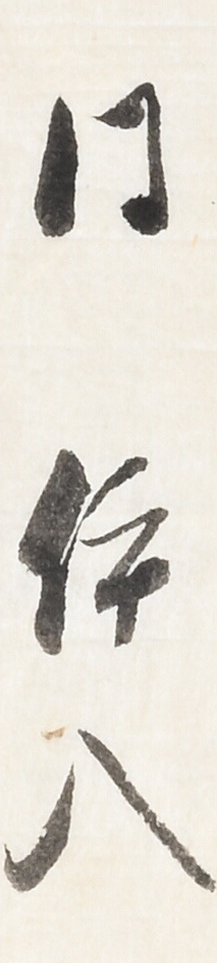同伊八
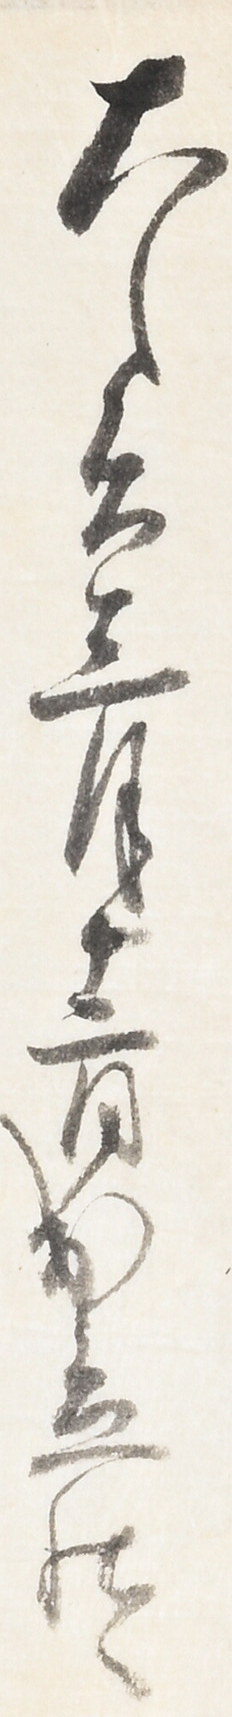右之者十二月十二日出立仕候
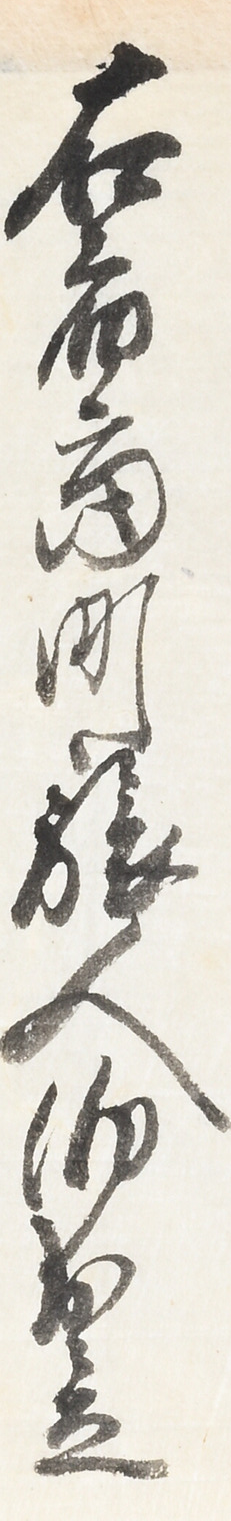右者当町旅人泊出立
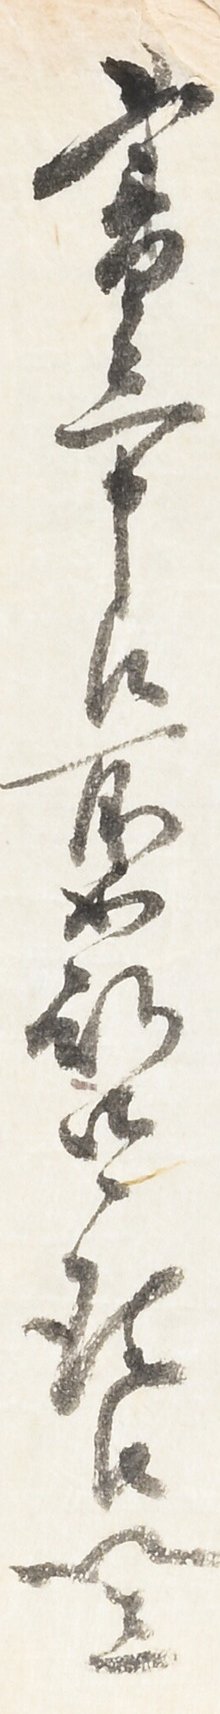書上申候所如斯御座候以上
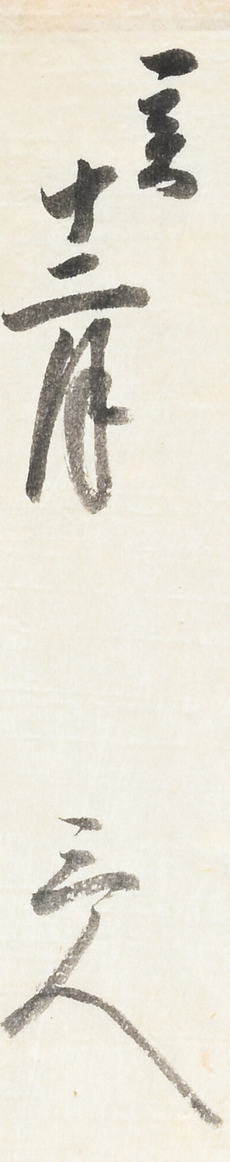十二月三人

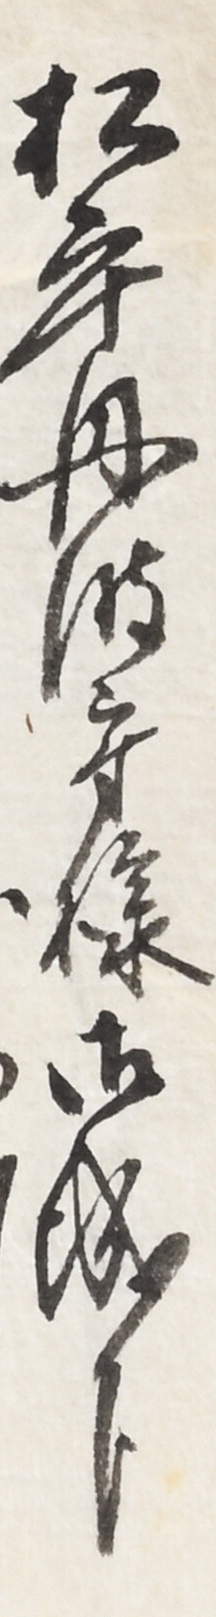松平丹波守様御城下
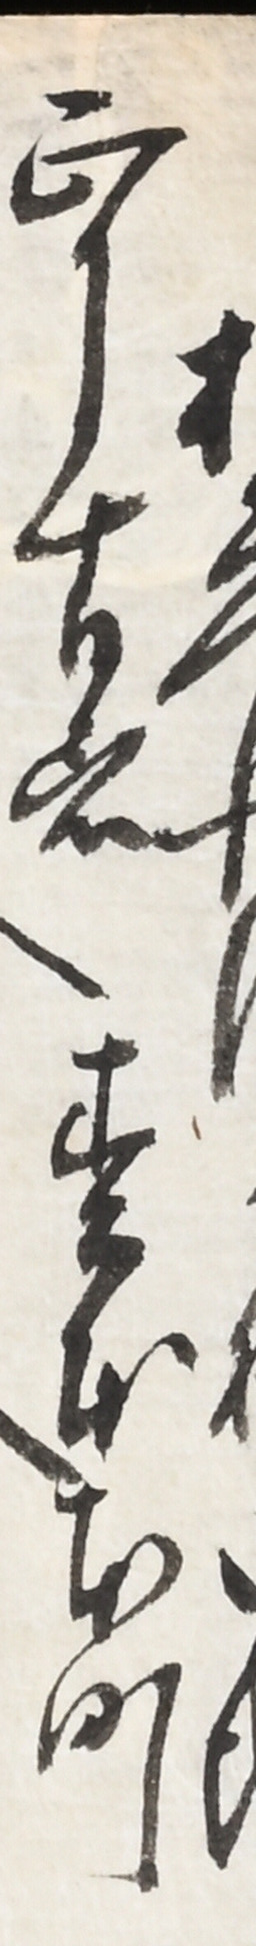正月十日着松本本町
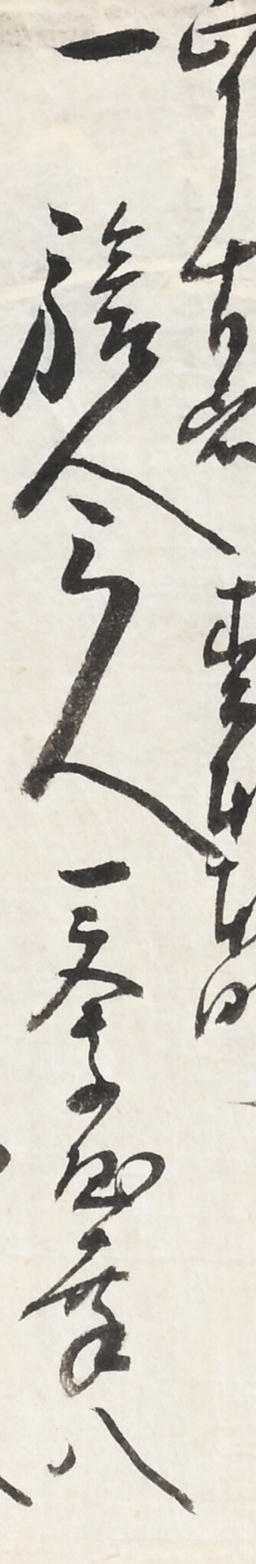一旅人三人一文字屋幸八
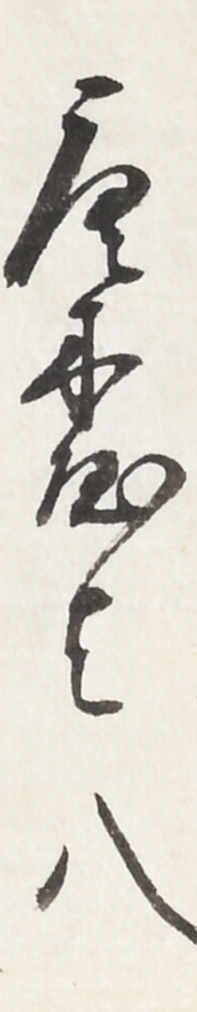唐木屋与八
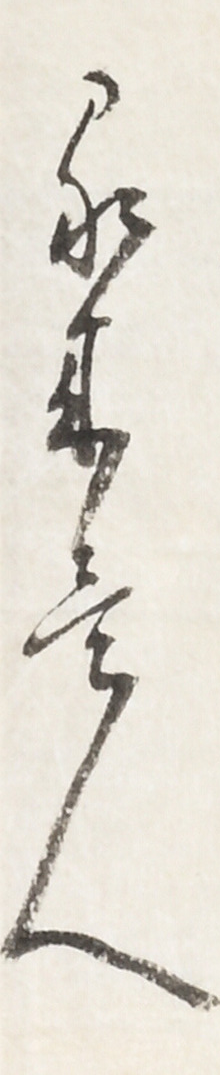家来壱人
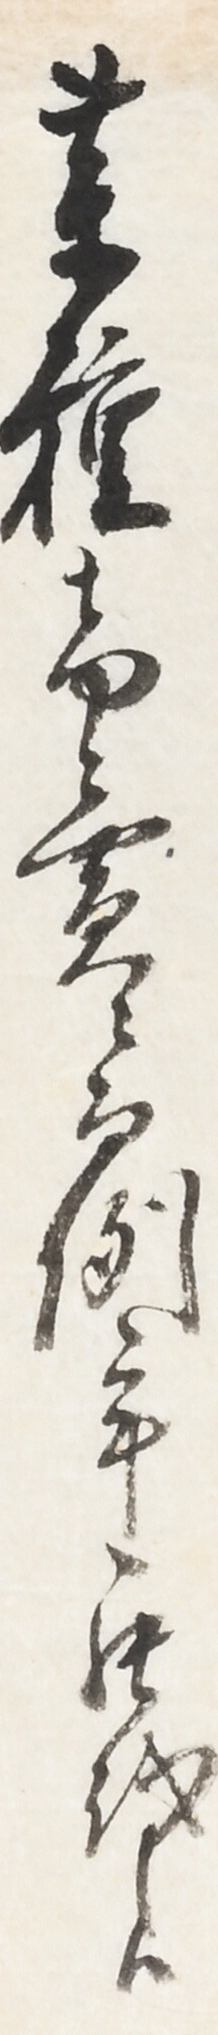薬種商売ニ而例年罷越申候
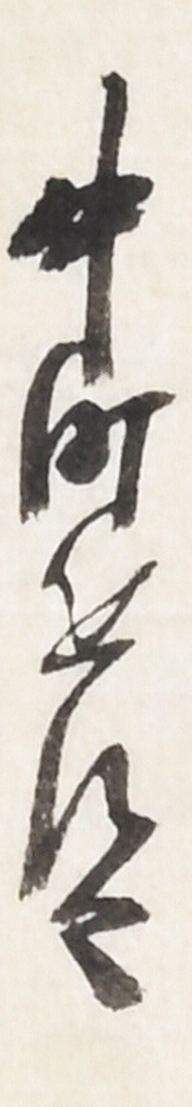中町近江屋
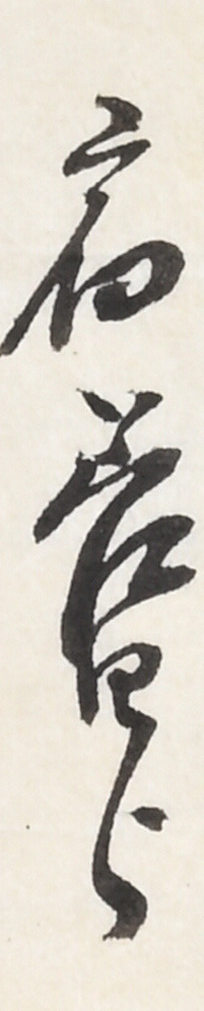宿善四郎
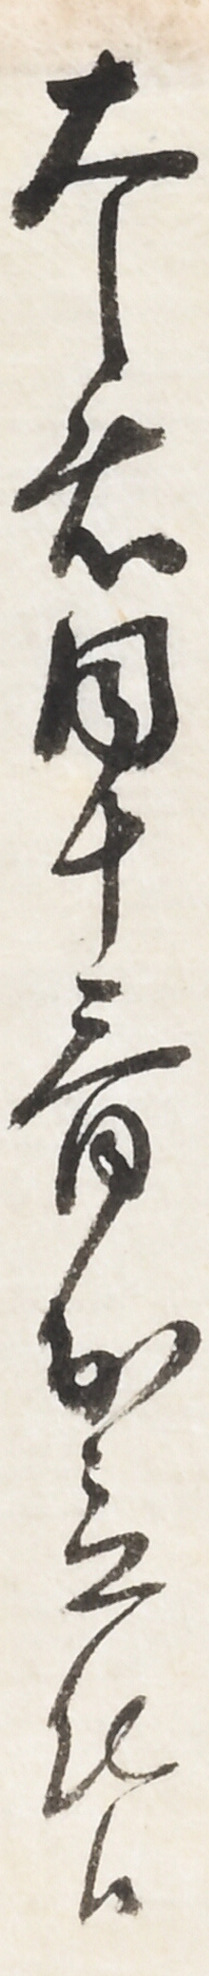右之者同十三日出立仕候
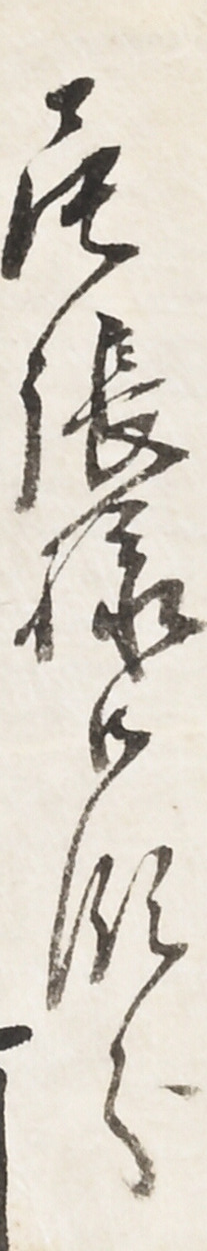尾張様御領分
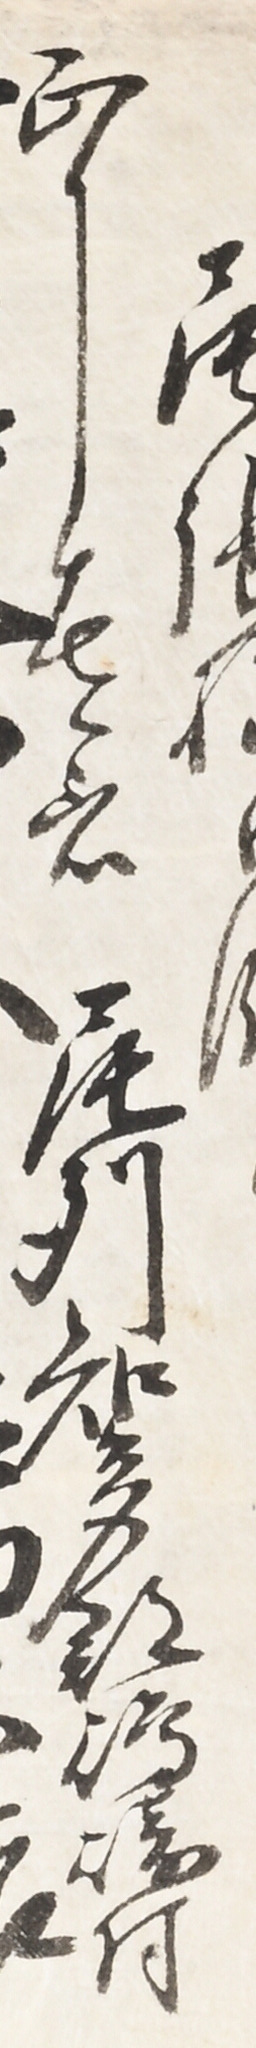正月十七日着尾州知多郡嶋崎村
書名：旅人泊控帳
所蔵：伊那市立高遠町図書館・合同会社AMANE
